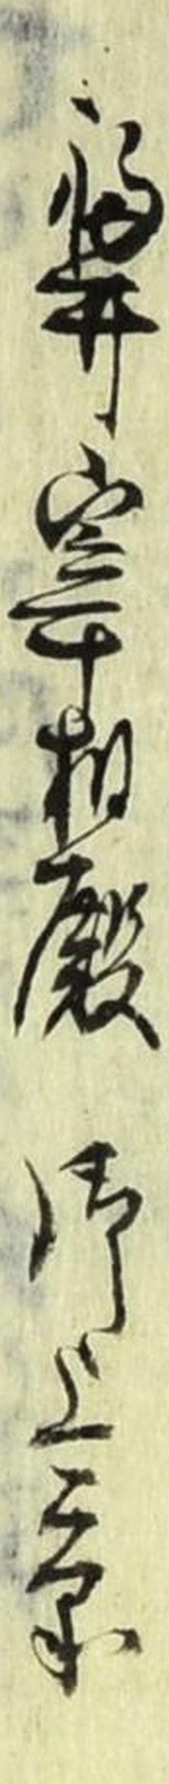福井宰相殿御上京
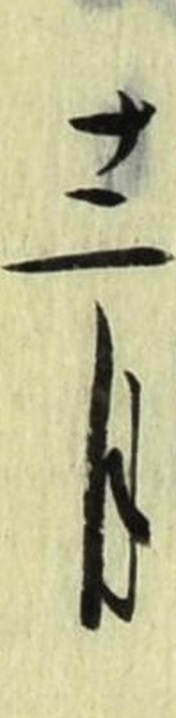十二月
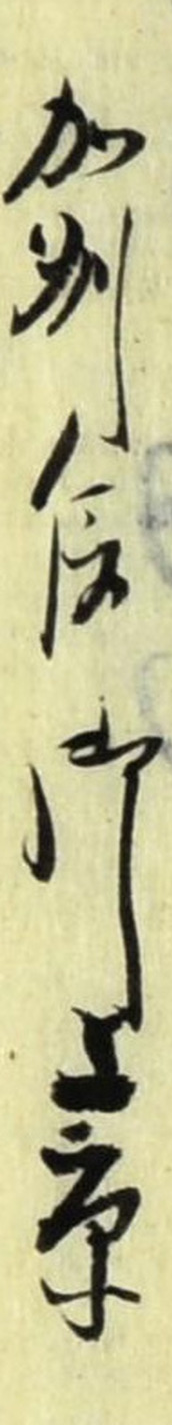加州侯御上京
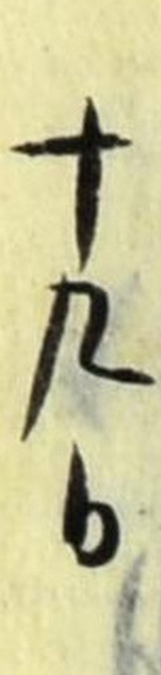十九日
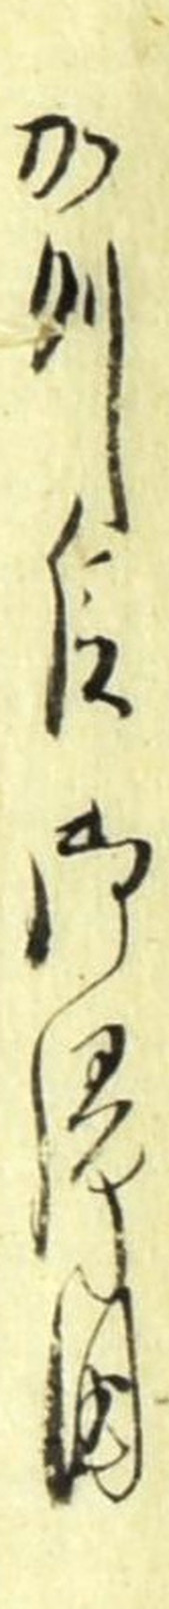加州侯御帰国

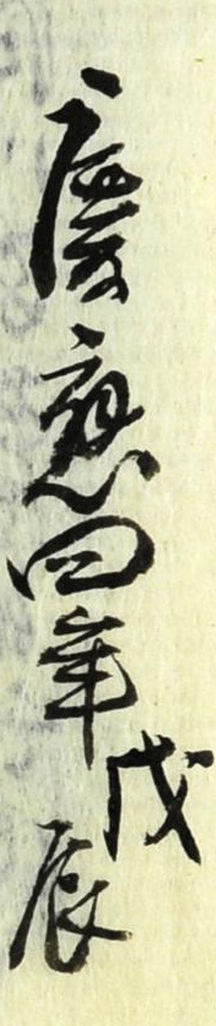慶応四年戊辰
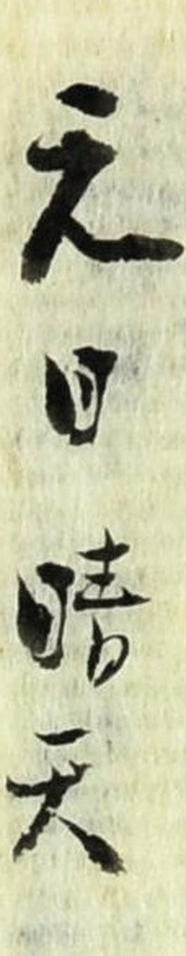元日晴天
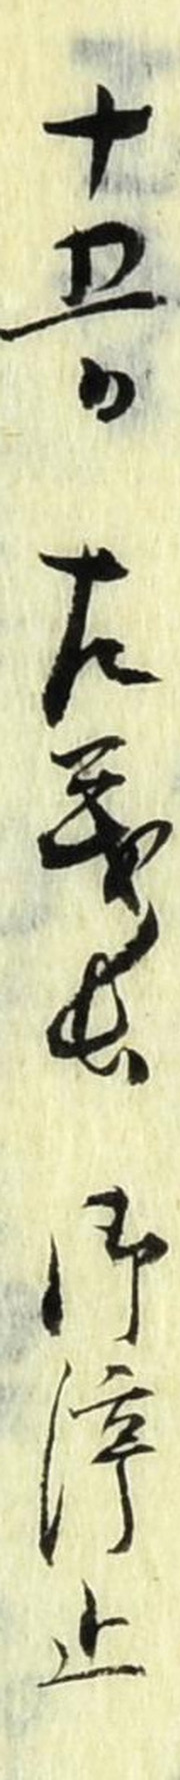十五日左義長御停止
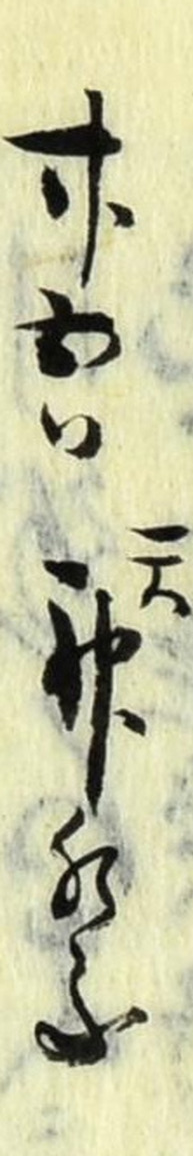廿五日天神祭
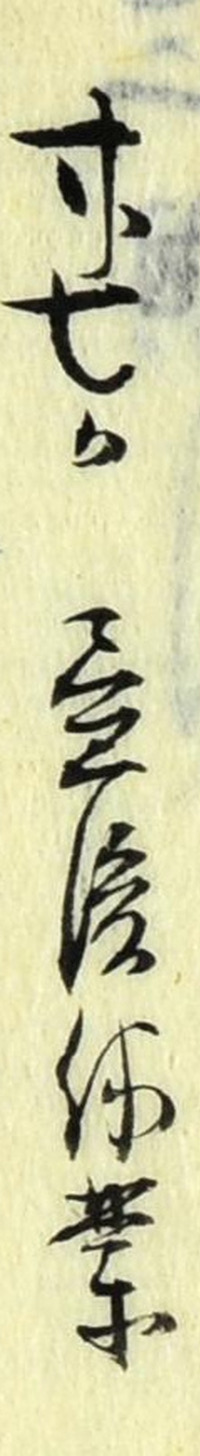廿七日昼後休業
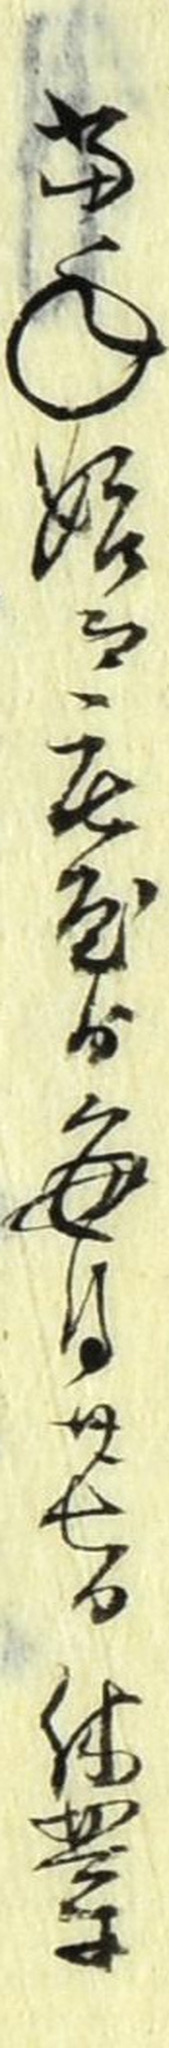当年始而庄屋ゟ毎月二十七日休業
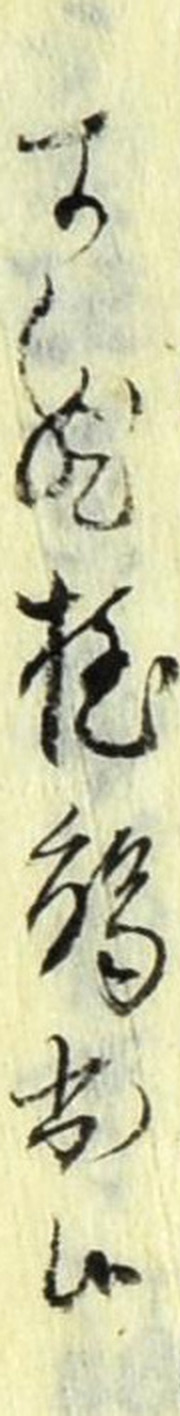可然極触出候

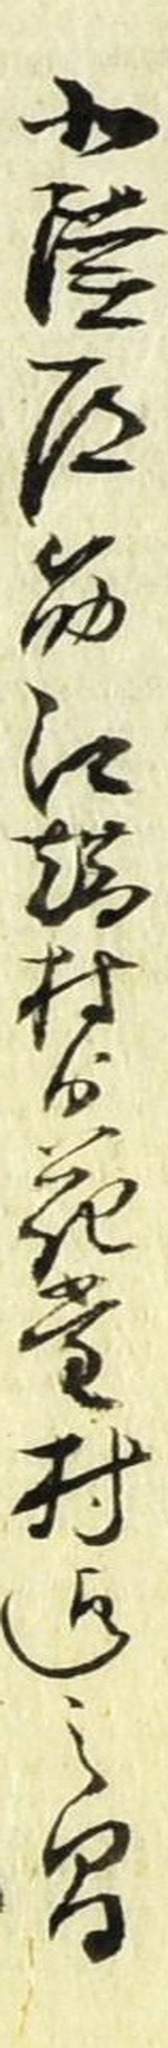北陸道筋江端村ゟ花堂村迄之間
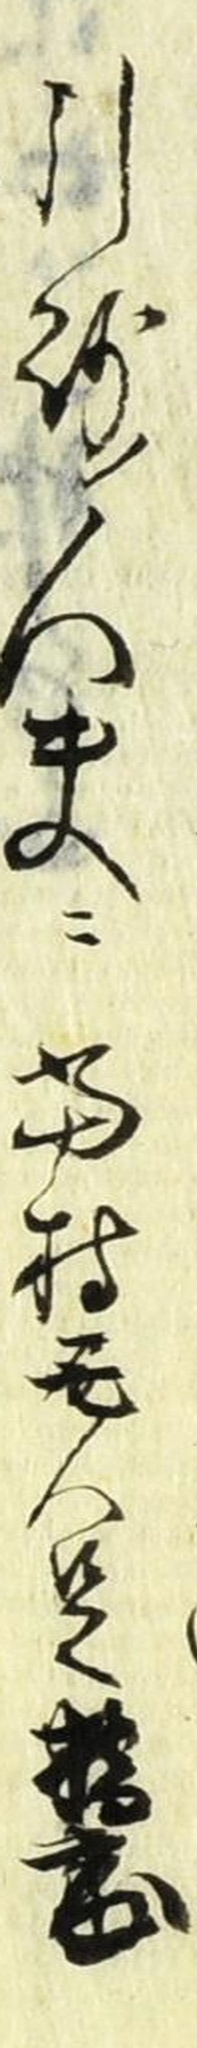引砂の人夫に当村も人足指出
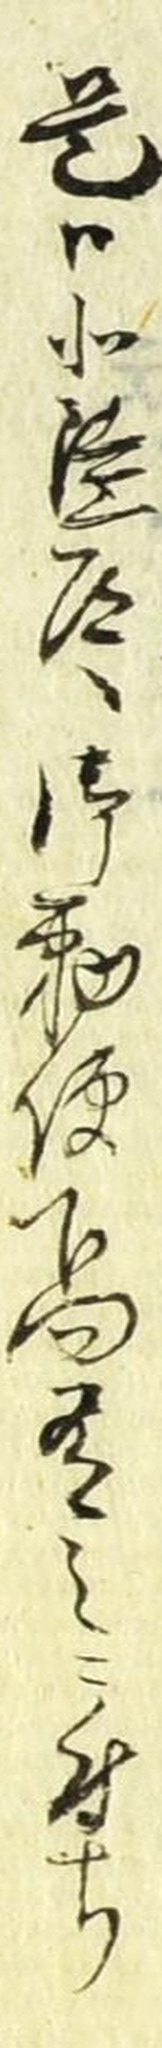是は北陸道へ御勅使下向有之に付なり
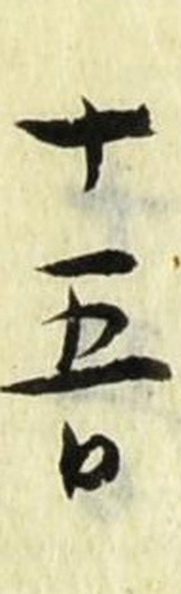十五日
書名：（日記）
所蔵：福井県文書館 Fukui Prefectural Archives
